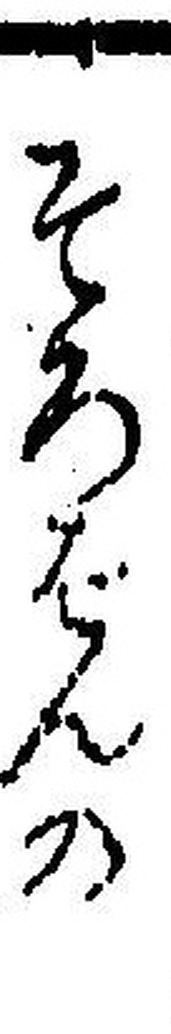そろばんの
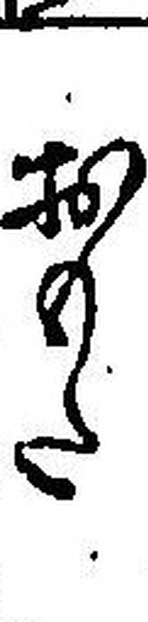おもた
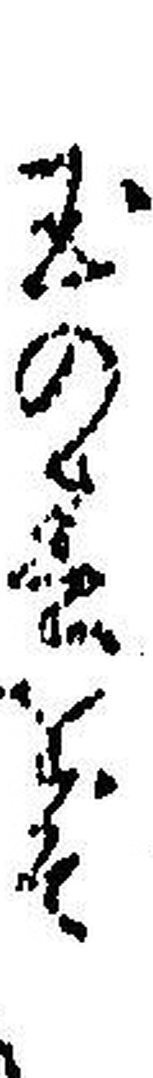玉の春をぞ
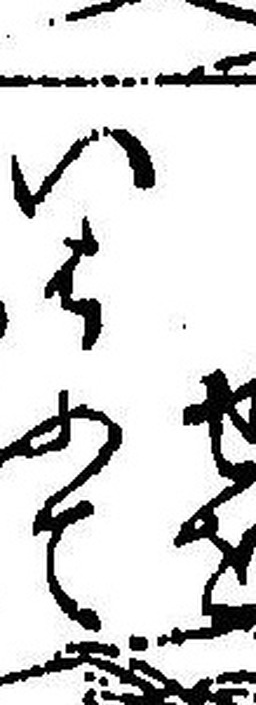いはふて
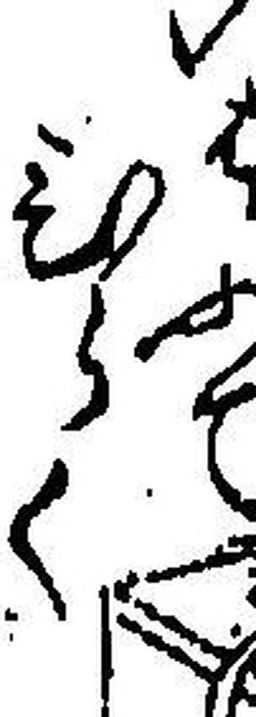ひらく
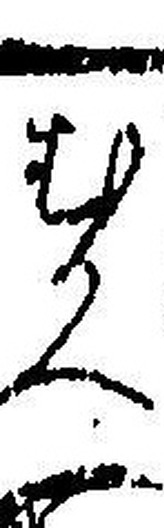むかへ
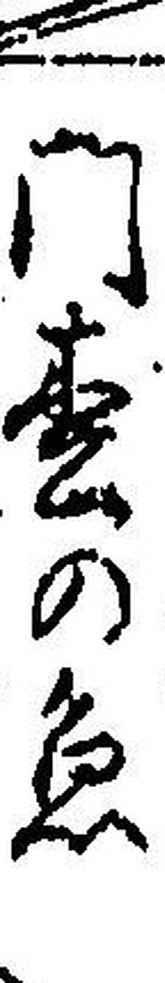門松の魚
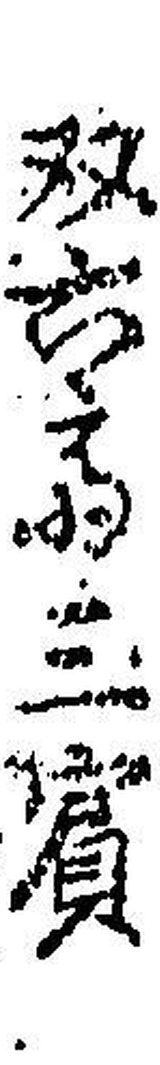双六斎三賓
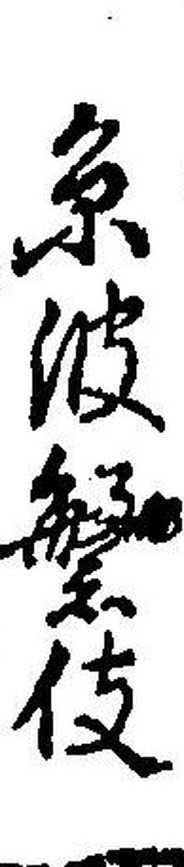糸波繁伎
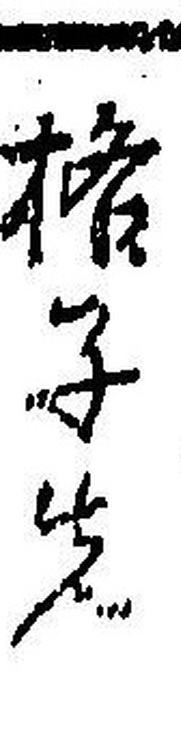梯子先
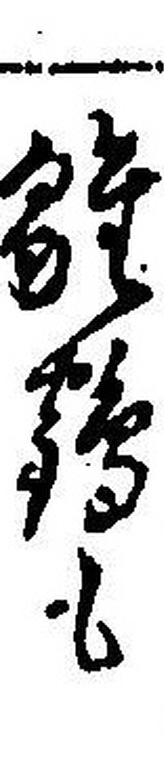雛鶴も
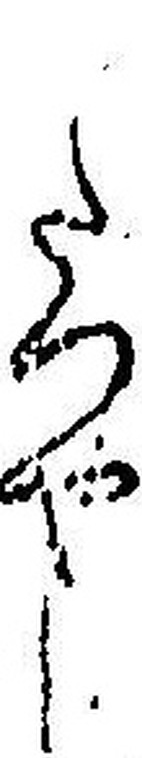たつや
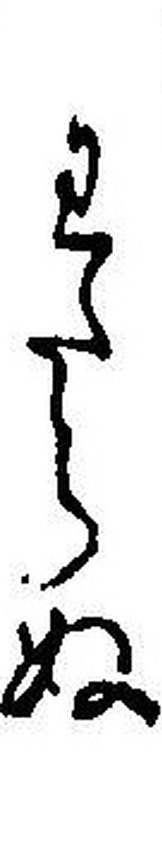わたらぬ
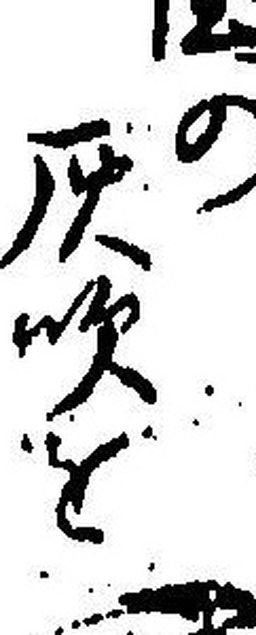灰吹を
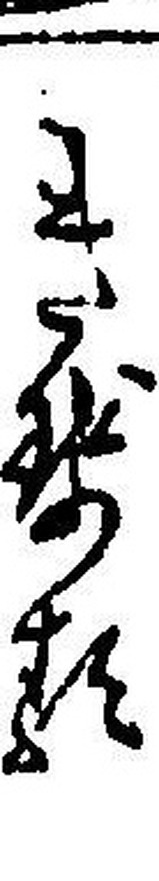きせる
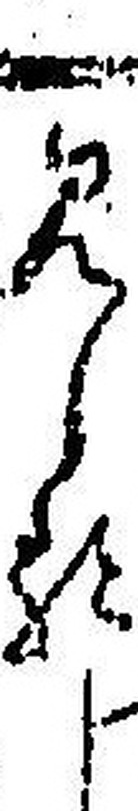見しる
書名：どうれ百人一首 / 鹿都部真顔(狂歌堂)編
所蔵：東京大学総合図書館 General Library in the University of Tokyo, JAPAN
